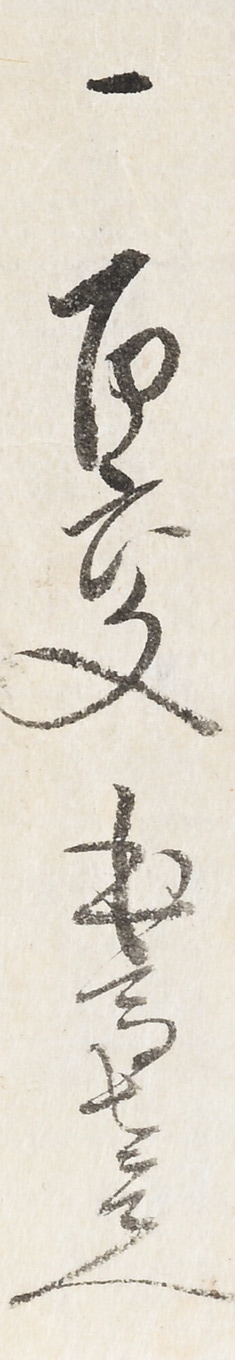一百六文本馬壱疋
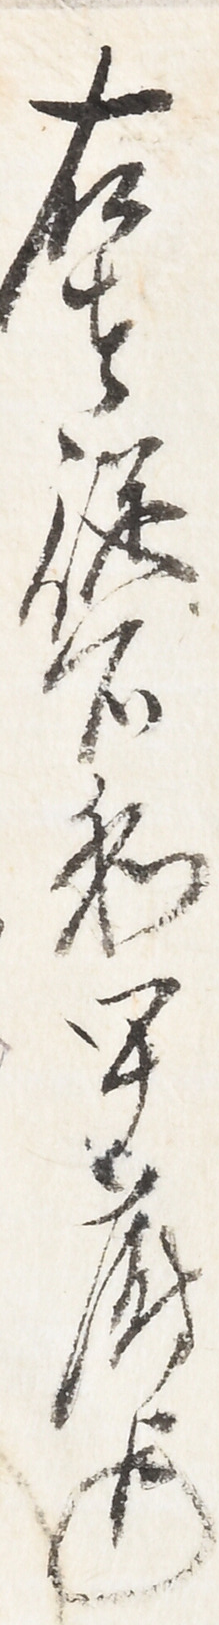右者従石和甲府迄
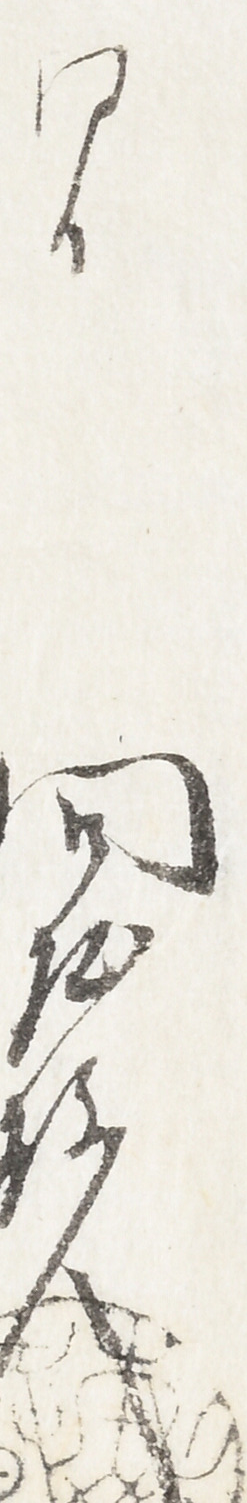同問屋役人印

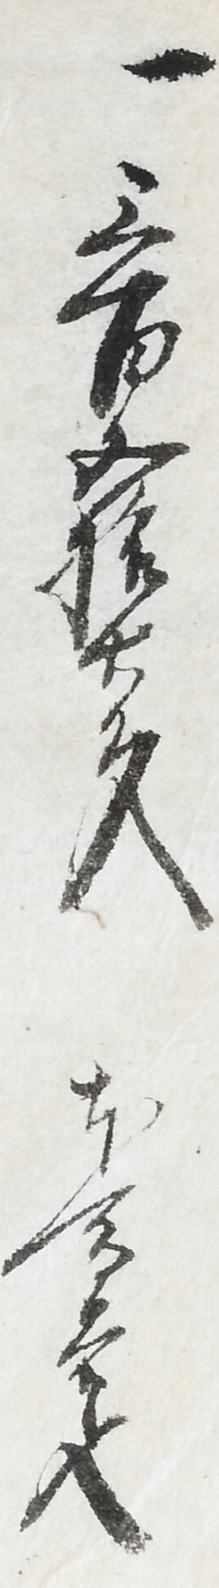一三百五拾六文本馬壱疋
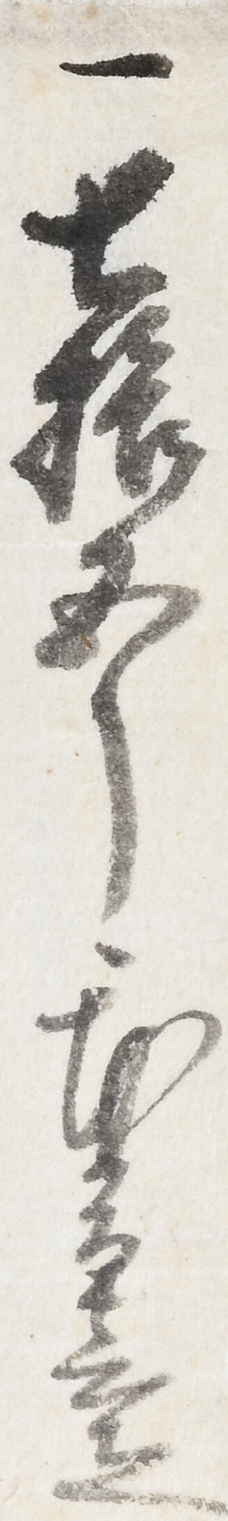一七拾五文本馬壱疋
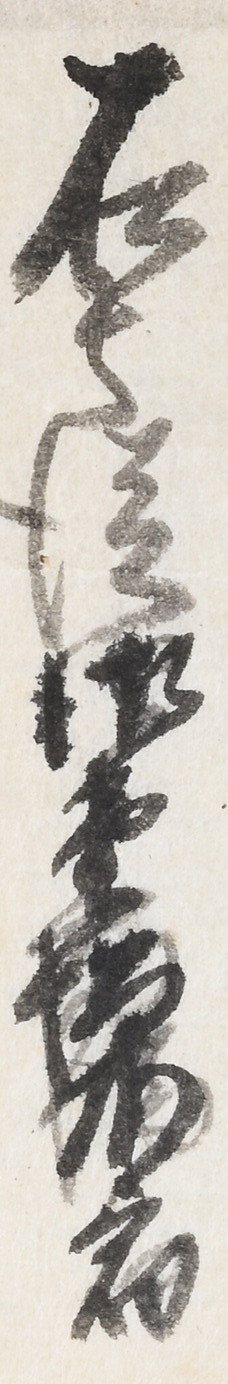右は従御堂垣外宿
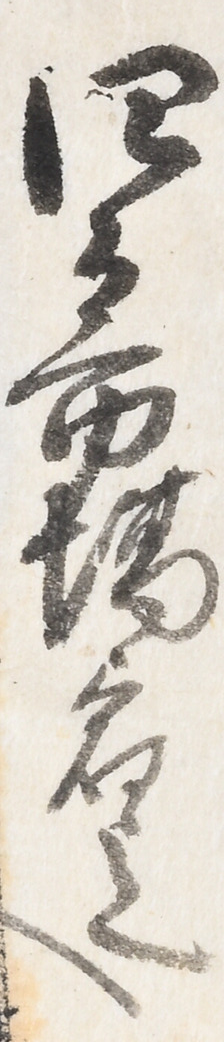四日市場宿
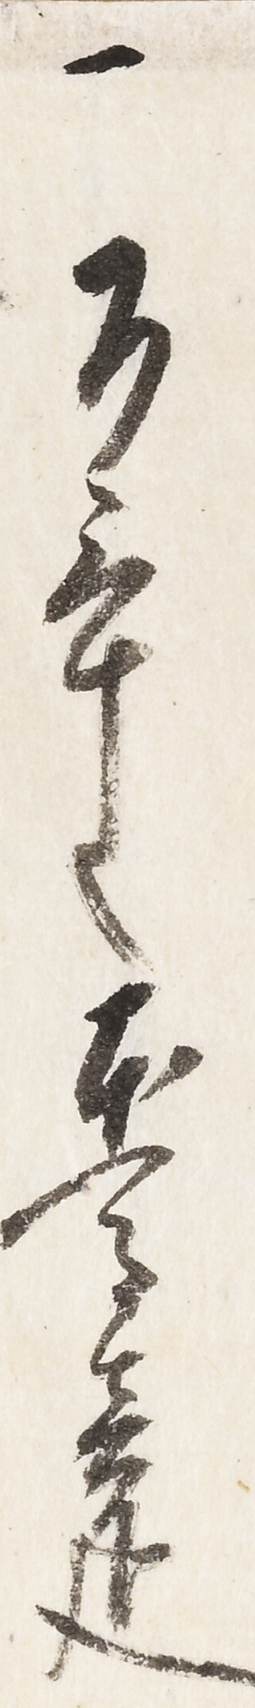一百三拾文本馬壱疋

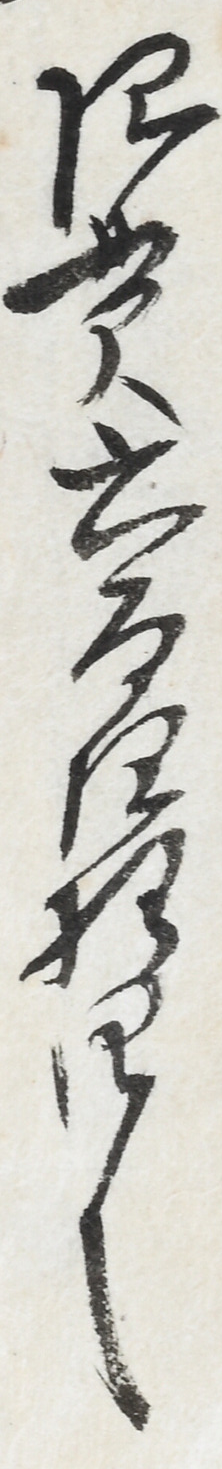〆四貫六百四拾四文
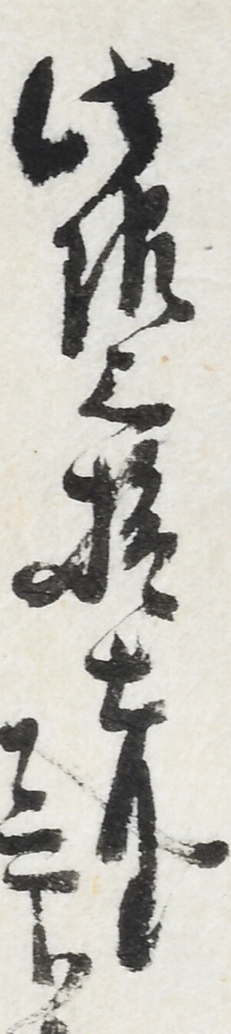此銀参拾七匁
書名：甲州通宿々駄賃払帳
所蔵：伊那市立高遠町図書館・合同会社AMANE
